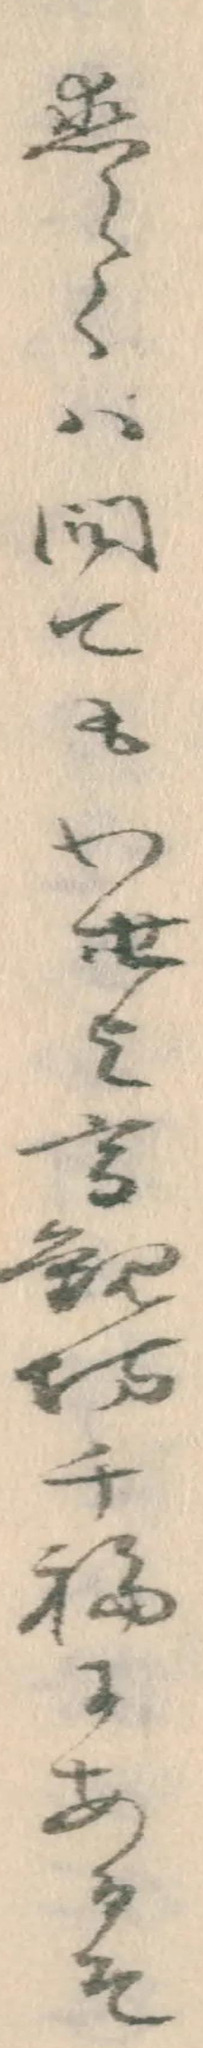恋しくは問てもわせよ高観坊千福にあるそ
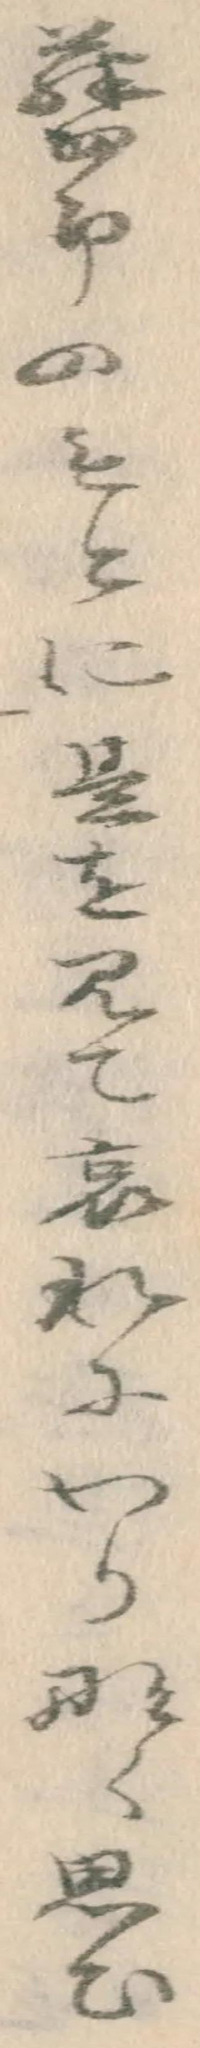藤四郎のもとに」是を見て哀れにわりなく思ひ
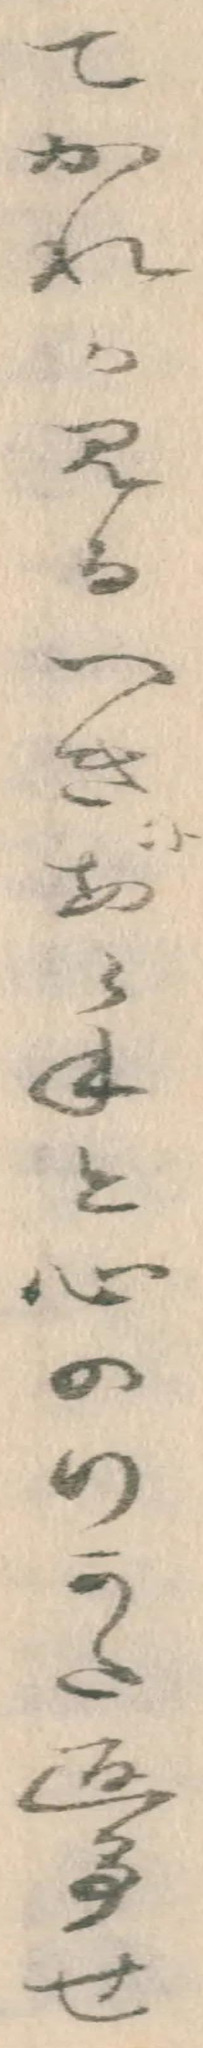てかれか見るへきにあらねと心のりかた返事せ
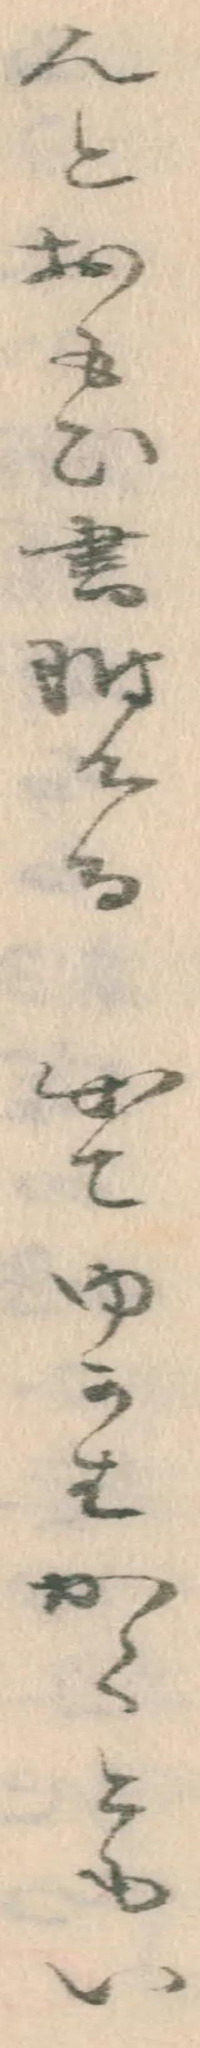んとおもひ書附ける出てゆかはかくともい
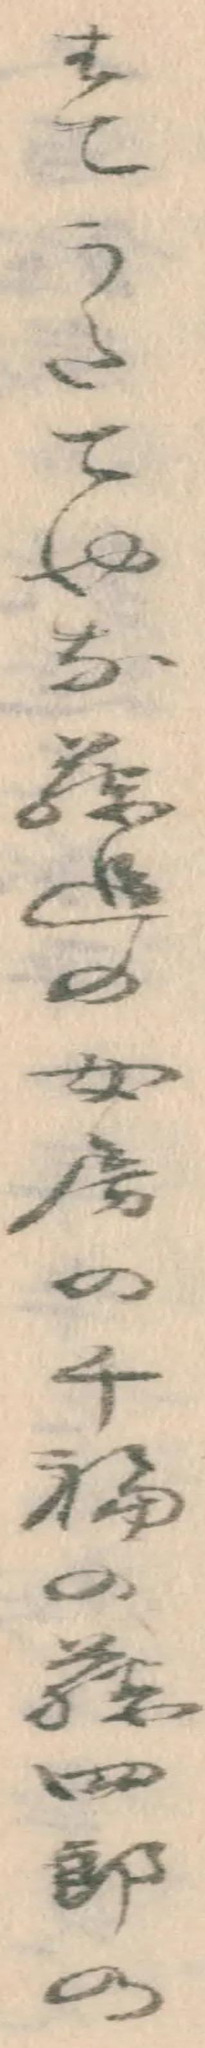はてうたてやな藤追の女房の千福の藤四郎の
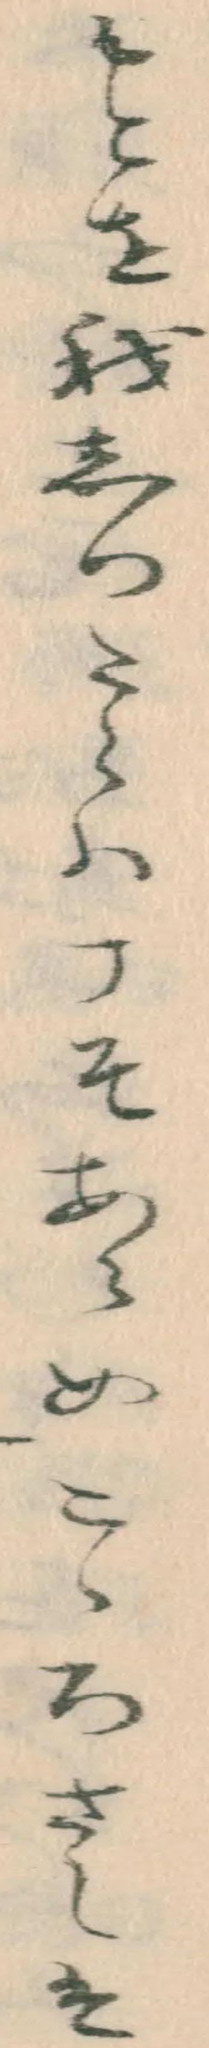もとを我しりたらはこそあらめ」こゝろさしは
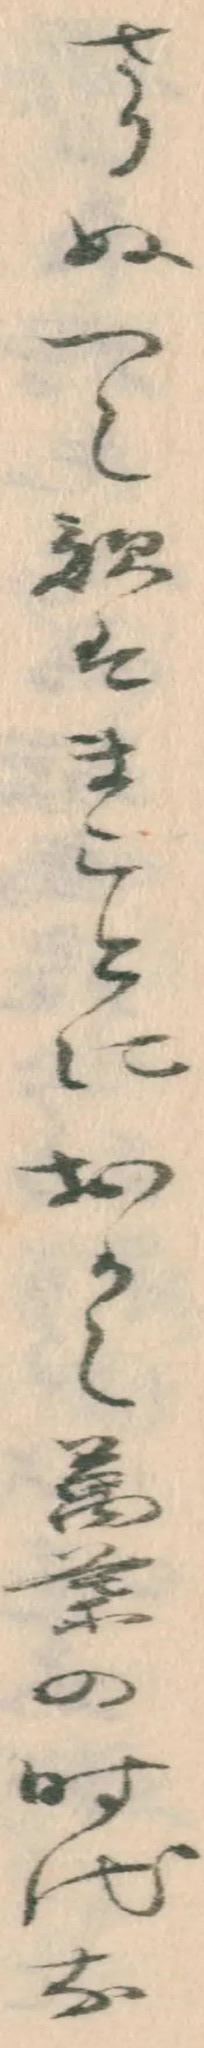さりぬへし歌はまことにおかし萬葉の时代な
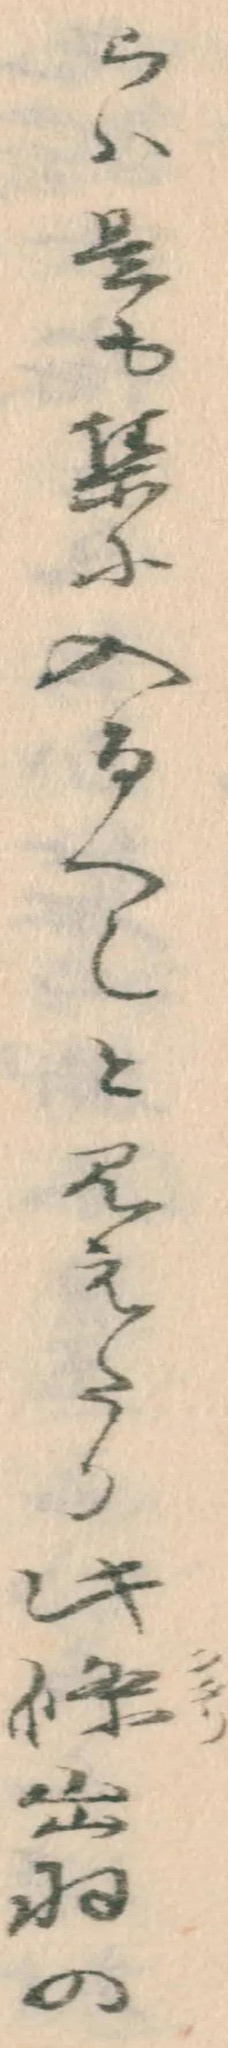らは是も集に入るへしと見えたり此條出羽の
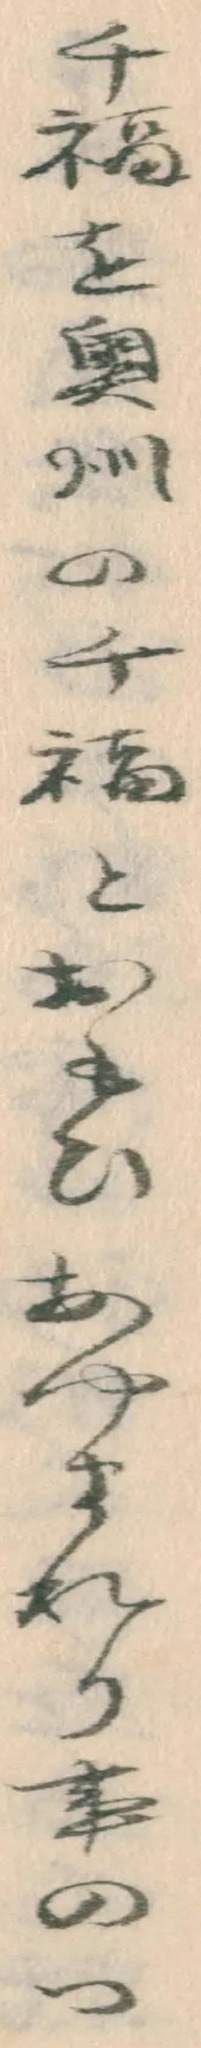千福を奥州の千福とおもひあやまれり事のつ
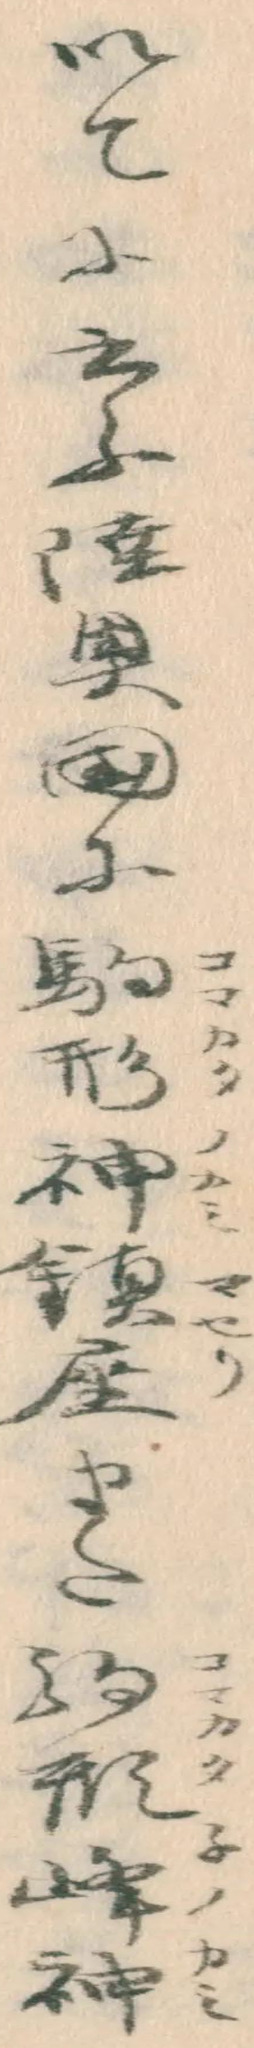いてに云ふ陸奥國に駒形神鎮座また駒形峰神
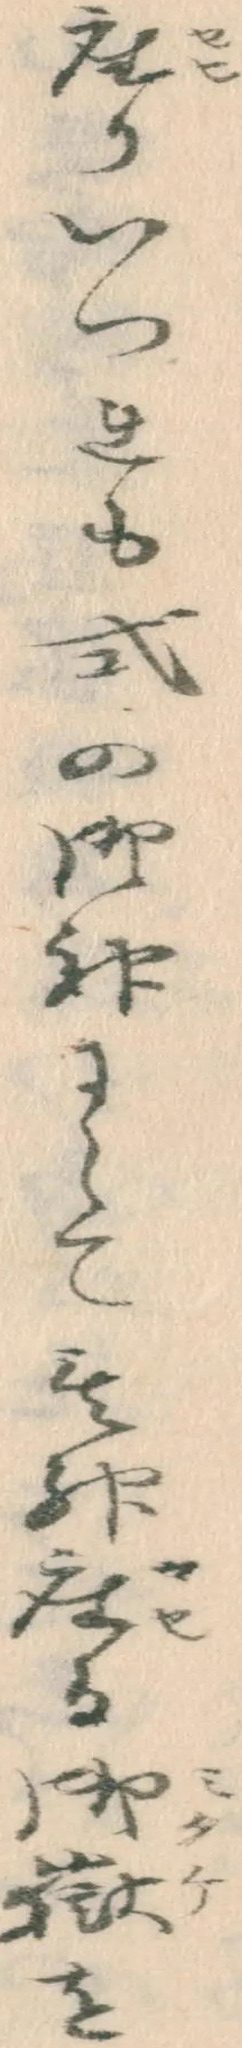座りいつれも式の御神にして其神座る御嶽を
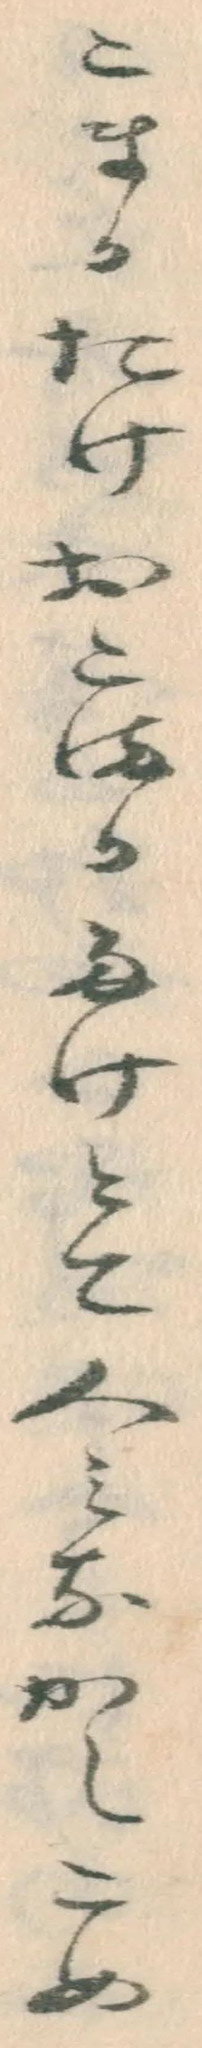こまるたけおこまりたけとて人みなかしこめ
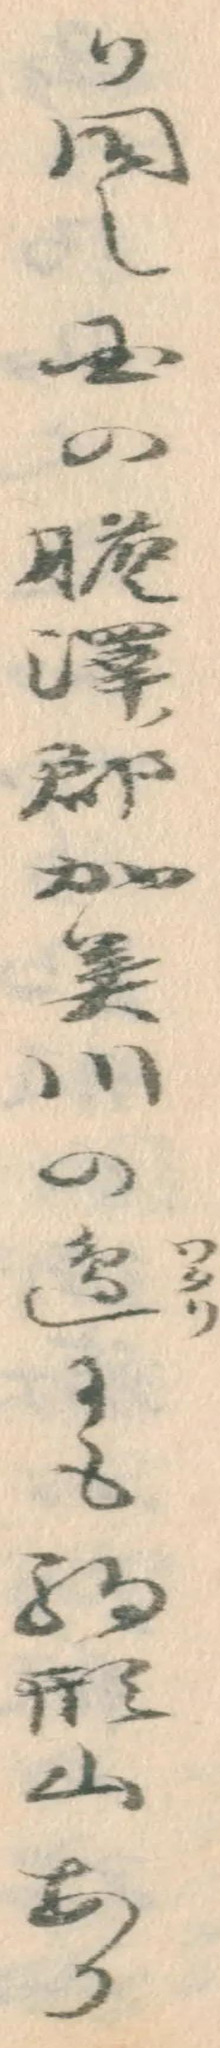り同し国の膽澤郡加美川の邊にも駒形山あり
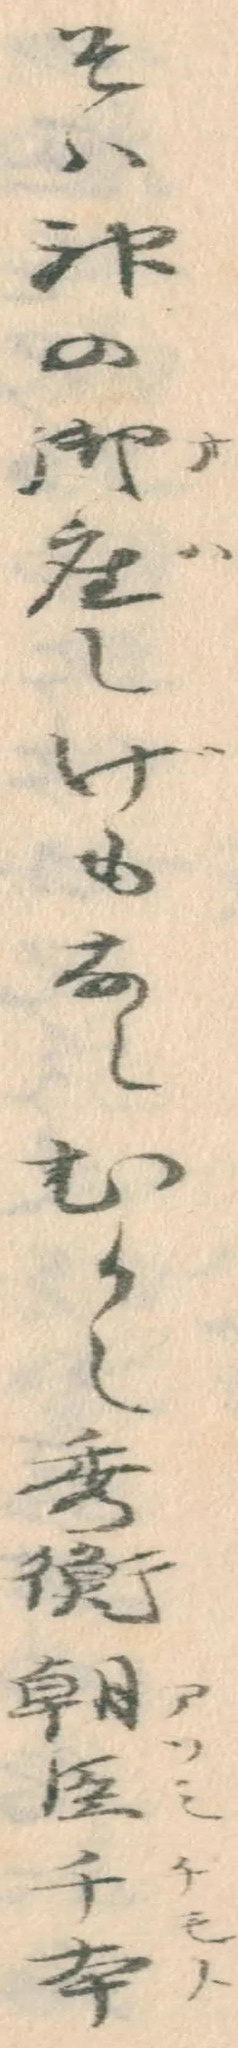そは神の御座しげもなしむかし秀衡朝臣千本
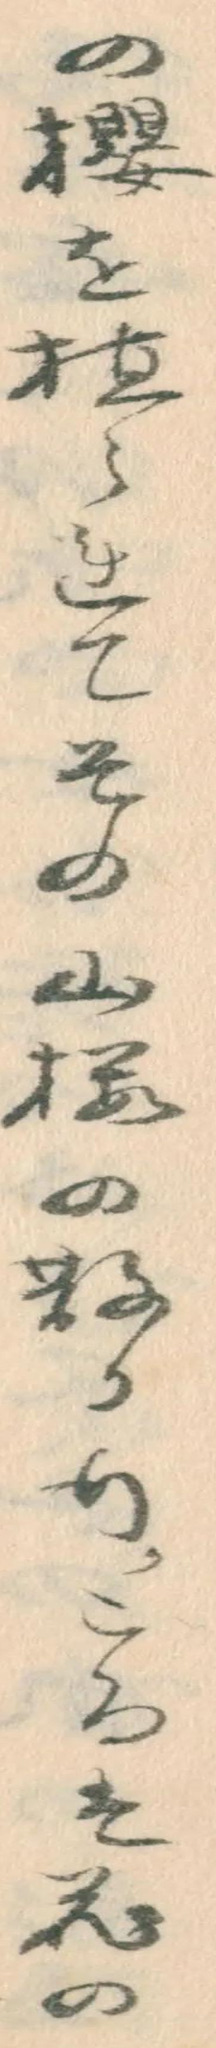の櫻を植られてその山桜の散り行ゝろそ花の

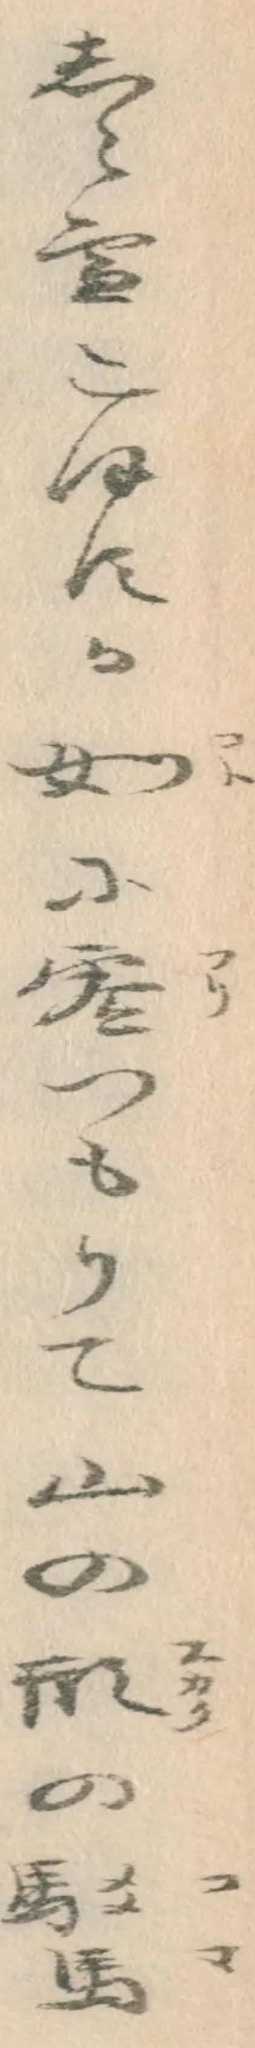しら雪こほする如に零つもりて山の形の駁馬
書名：眞澄遊覽記[第2冊]
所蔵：国立国会図書館 National Diet Library, JAPAN
